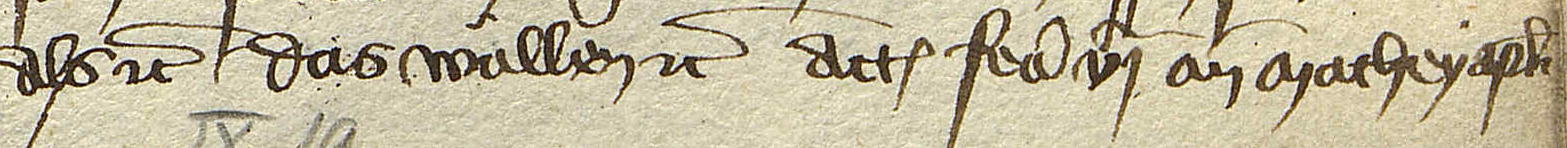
Als ec* / das wöllen ec* Act* fea* iii* an* Mathey Apli*
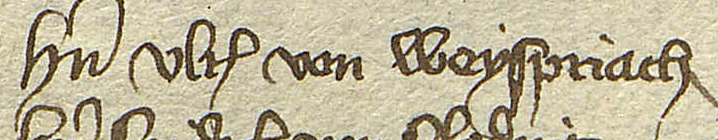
hn* vlr* von Weyſpriach
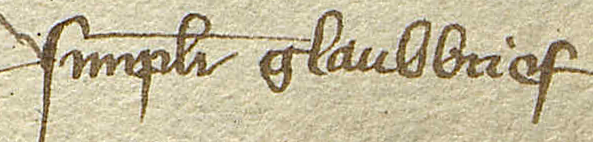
ſimplr* glaubbrief
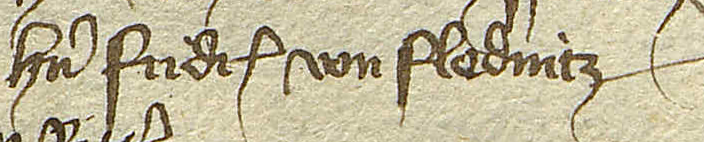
hn* fridr* von flednicʒ
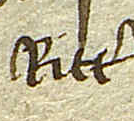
Ritt*
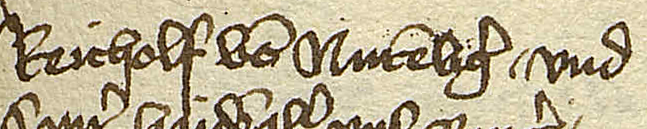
Reicholf vo* Nure*bg* / vnd
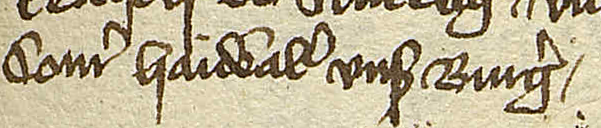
Conr* haide*ab* vnſ* Burg* /
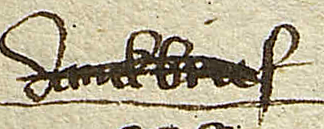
Danckbrief
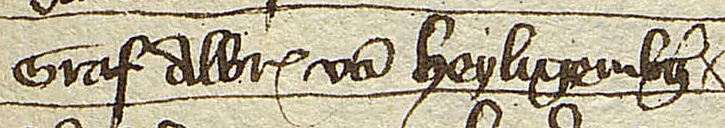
Graf Albr* vo* heyligembg* /
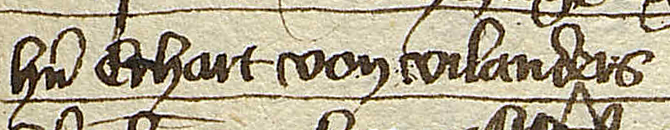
hn* Erhart von vilanders
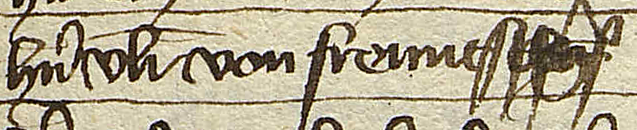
hn* vlr* von freuntſ%%%%
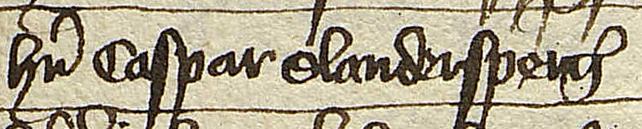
hn* Caſpar Slanderſperg*
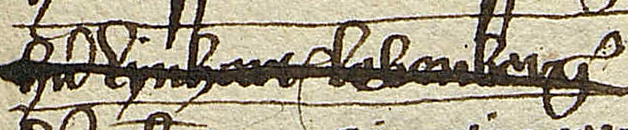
hn* Lynhart* lebenberg*
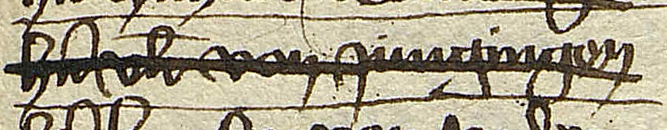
hn* vlr* von %%ngingen
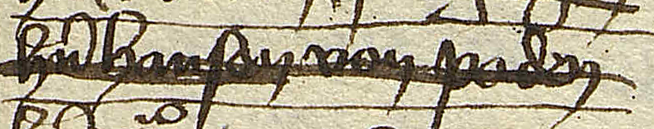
hn* hanſen von Poden
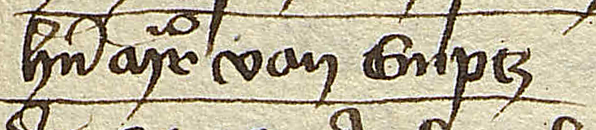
hn* Mr* von Enpcʒ
